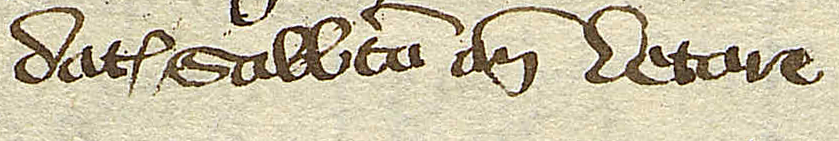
dat* Sabbto* an* Letare
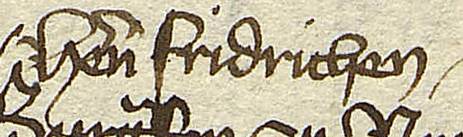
he*n Fridrichen /
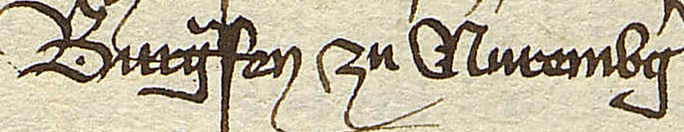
Burg*fen cʒu Nurembg*
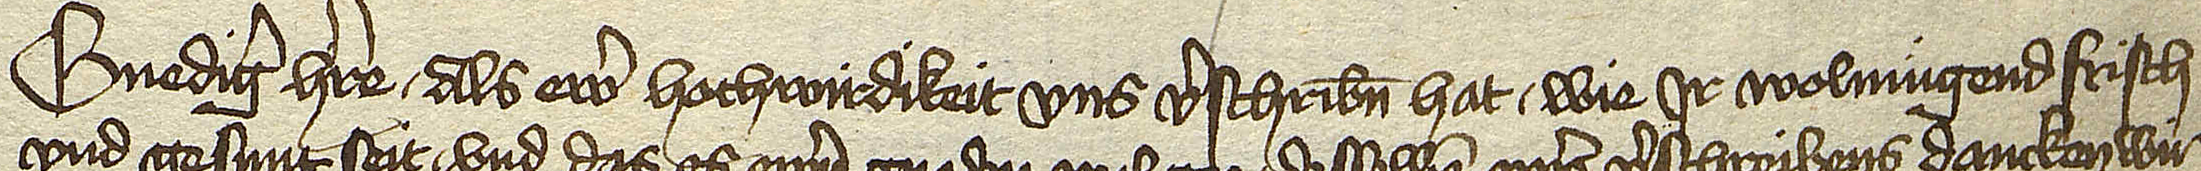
Gnedig* h*re / Als ew* hochwirdikeit vns v*ſchribn* hat / wie Ir wolmügend friſch
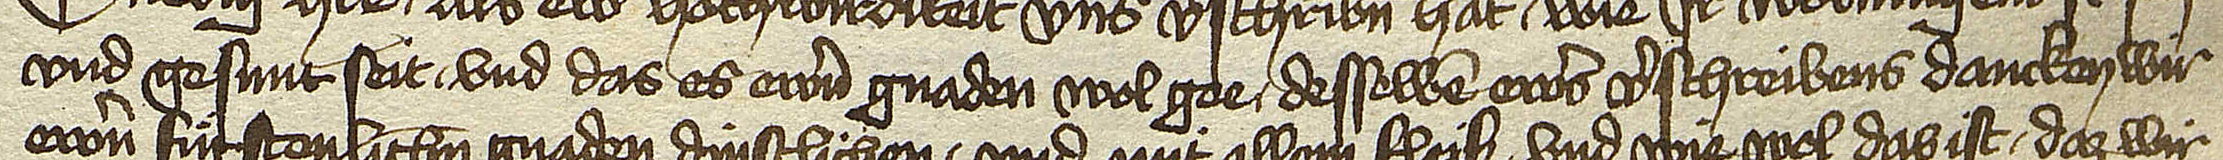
vnd geſunt ſeit / vnd das es ewn* gnaden wol gee / deſſelbe* ewr* v*ſchreibens dancken wir
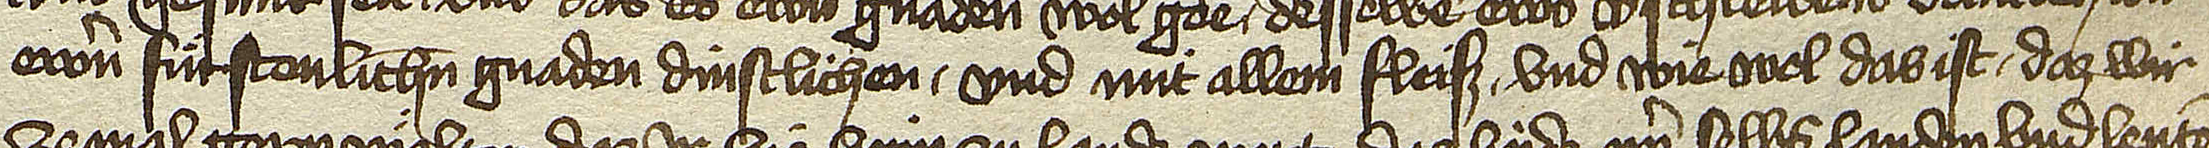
ewn* fürſtenlichn* gnaden dinſtlichen / vnd mit allem fleiſʒ / vnd wie wol das iſt / daʒ wir
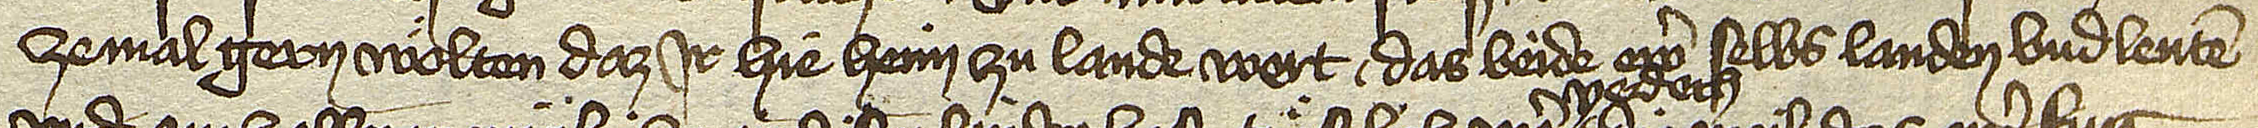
cʒemal gern wölten daʒ Ir hie heim cʒu lande wert / das beide ew* ſelbs landen vnd leute*
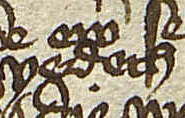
yedoch
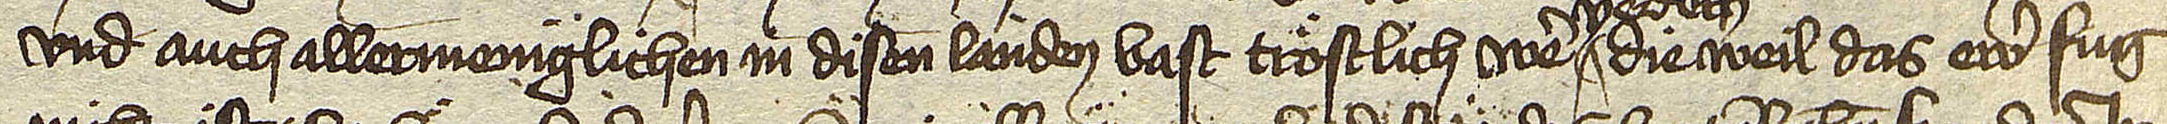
vnd auch allermeniglichen in diſen landen vaſt tröſtlich we* / die weil das ew* fug
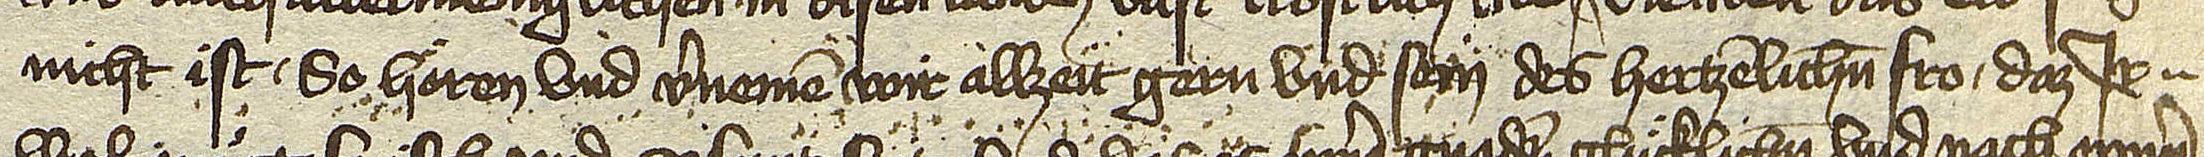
nicht iſt / So hören vnd v*neme* wir allʒeit gern vnd ſein des hertʒe*lichn* fro / daʒ Ir ~
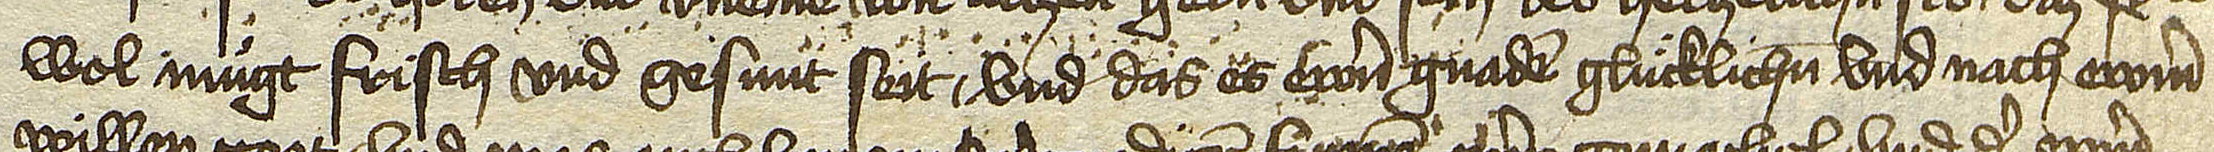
wol mügt friſch vnd geſunt ſeit / vnd das es ewn* gnade* glücklichn* vnd nach ewm*
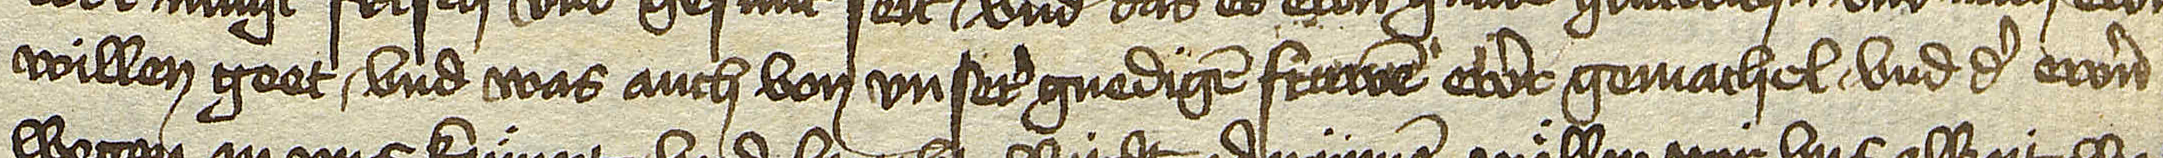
willen geet / vnd was auch von vnſer* gnedige* frawe* ew*r gemachel / vnd d* ewn*
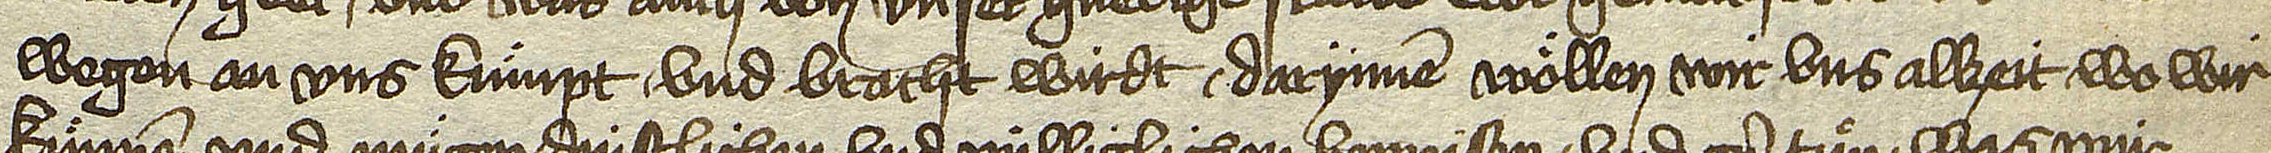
wegen an vns kümpt / vnd bracht wirdt / darynne* wöllen wir vns allʒeit / wo wir
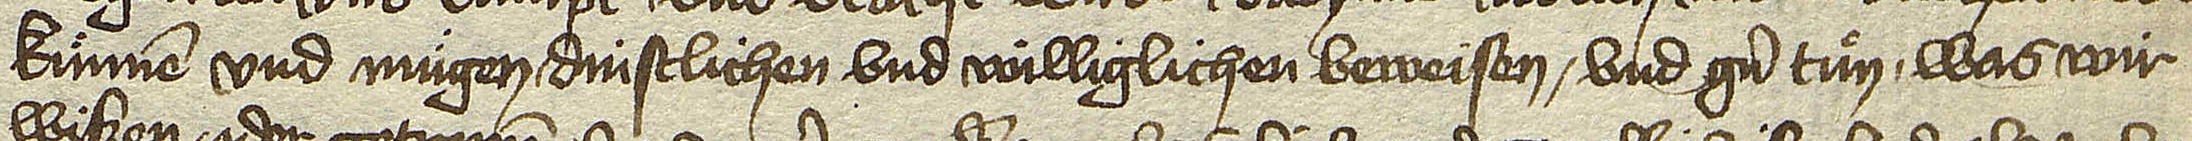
künne* vnd mügen / dinſtlichen vnd williglichen beweiſen / vnd gn* tün / was wir
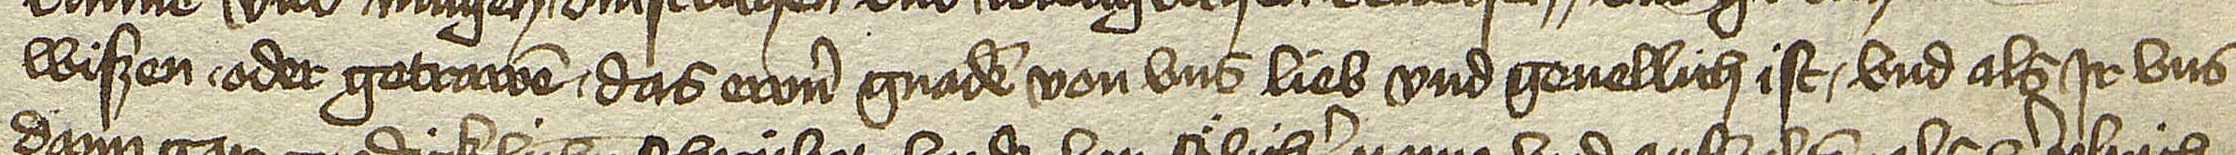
wiſʒen / oder getrawe* / das ewn* gnade* von vns lieb vnd geuellich iſt / vnd als Ir vns
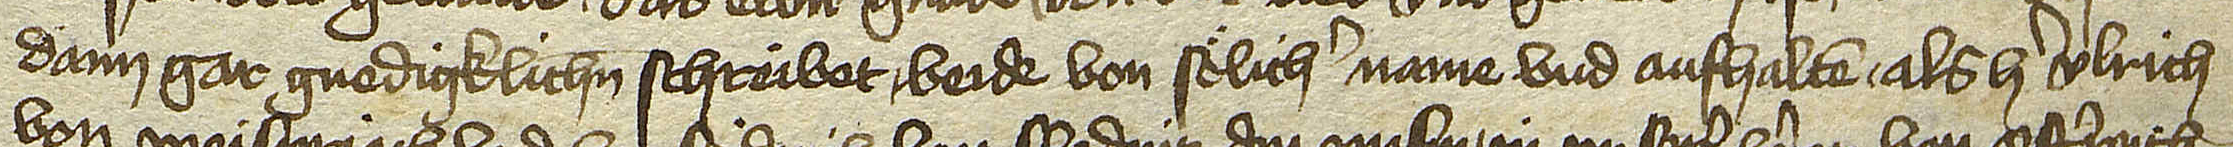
dann gar gnedigklichn* ſchreibet / beide von ſölich* name vnd aufhalte* / als h* vlrich
